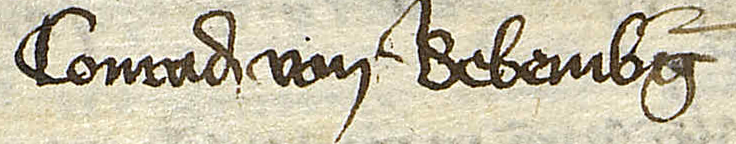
Conrad* von Bebembg*
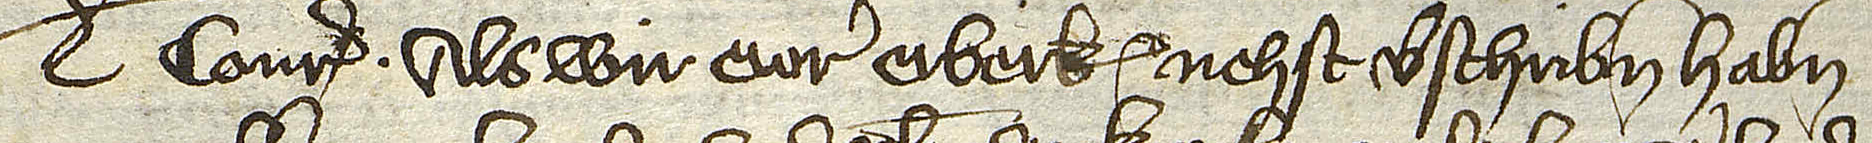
L* Conr* . Als wir ewr* erberk* nehſt v*ſchribn* habn*
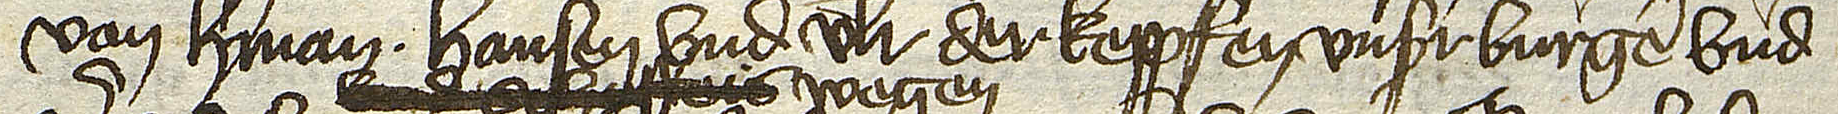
von hman* . hanſen vnd vlr* der keppfen vnſr* burge* vnd
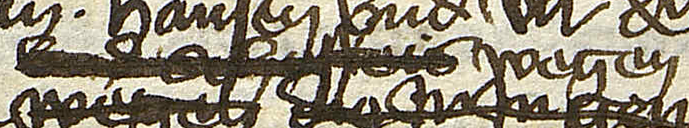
vnd Sch%%%%is wegen
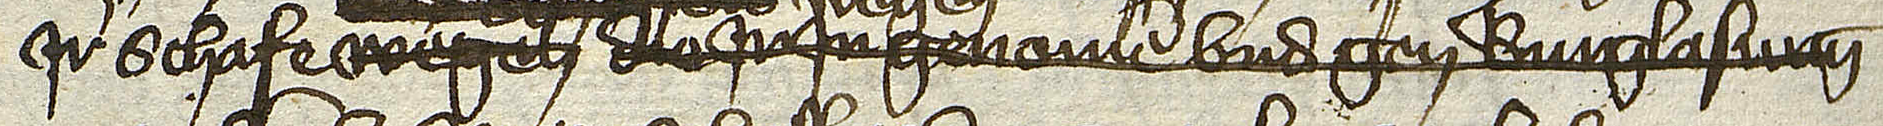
Ir* Schafe wegen die Ir In genome* vnd gen Burglaſwag
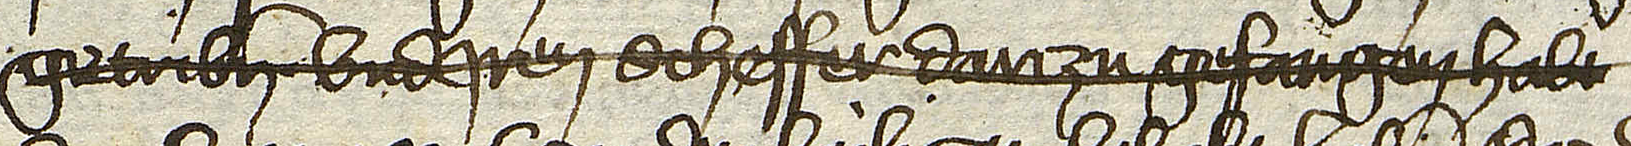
getribn* vnd Iren Scheffer darcʒu gefangen habt
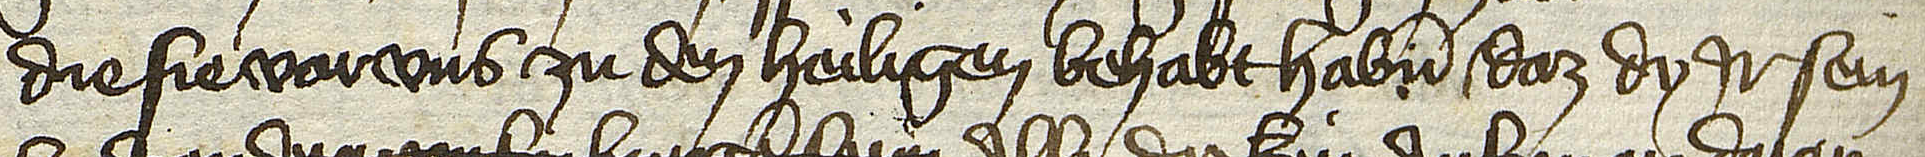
die ſie vor vns ʒu den heiligen behabt habn* daʒ dy Ir ſein
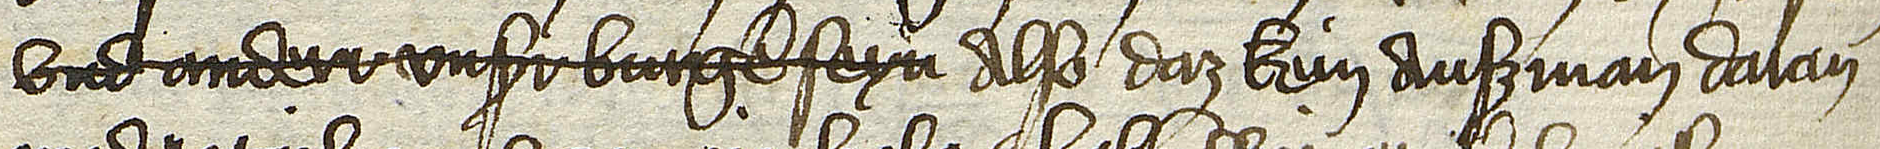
vnd anderr vnſ*r burge* ſeyn Alſo daʒ kein Auſʒman daran
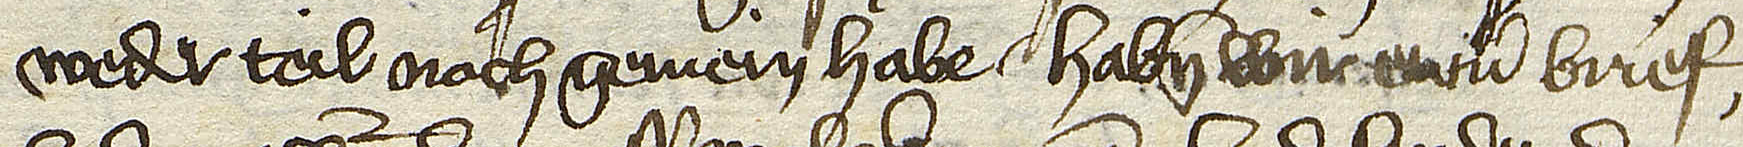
weder teil noch gemein habe / habn* wir ewn* brief
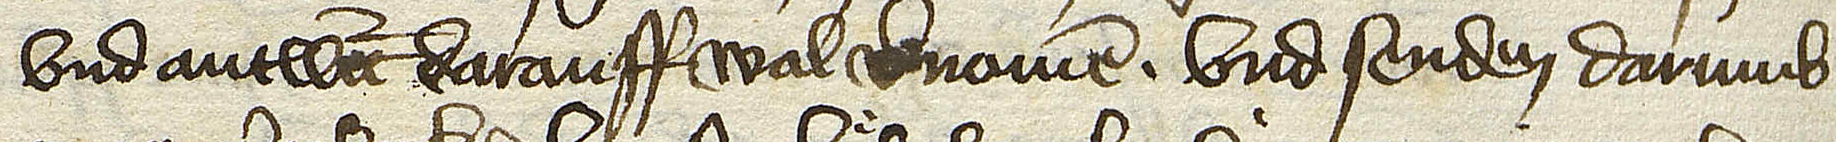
vnd antwtt* darauff wol vnome* . vnd ſenden darümb
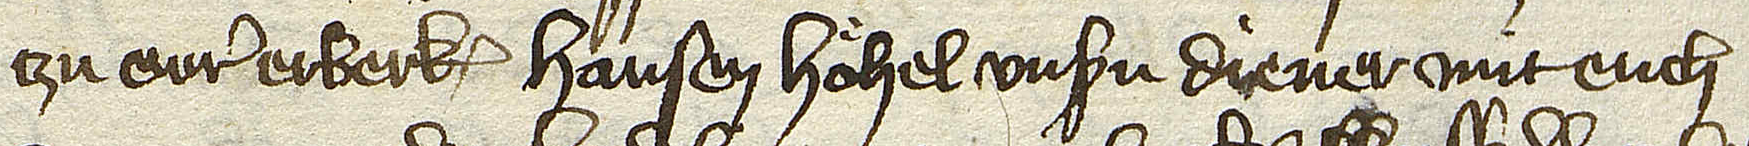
cʒu ewr* erberk* hanſen höhel vnſn* diener mit euch
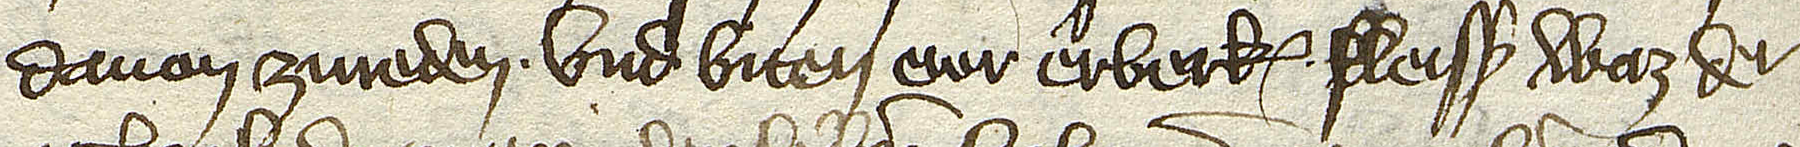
davon ʒureden . Vnd biten wir ewr erberk* . fleiſſ* waʒ der
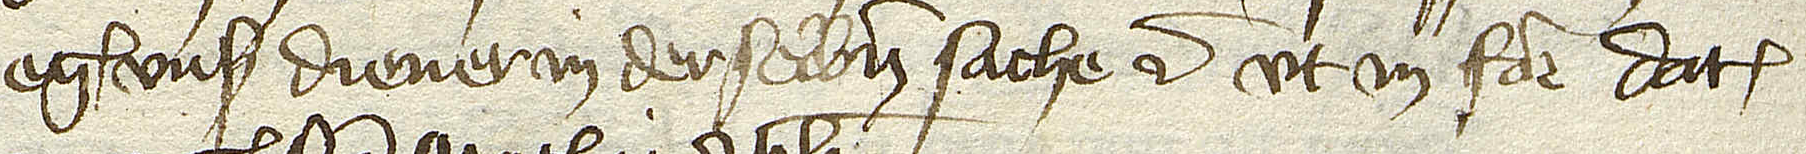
eg*vnſ* diener in der ſelbn* ſache ec vt in for* Dat*
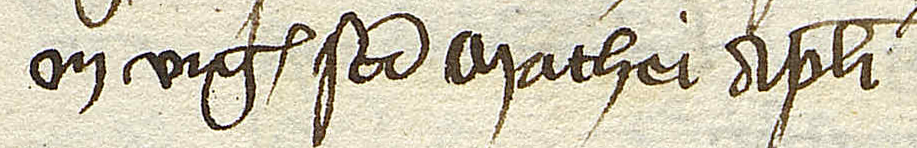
in vig* ſci* Mathei Apli*
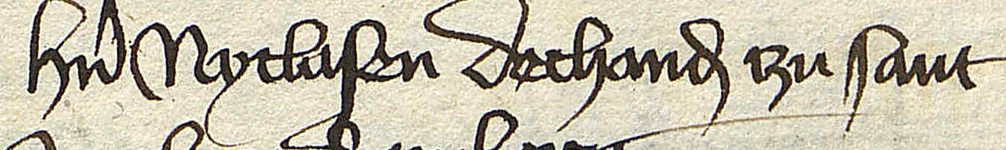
Hn* Nyclaſen Dechand* cʒu ſant
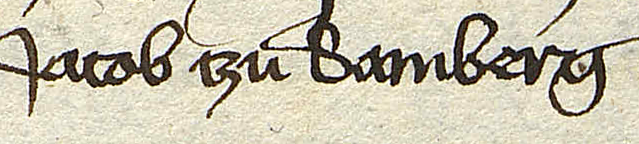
Iacob cʒu Bamberg
